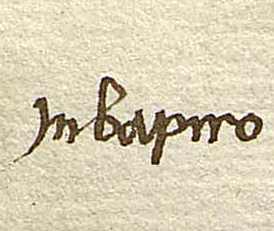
in bapiro
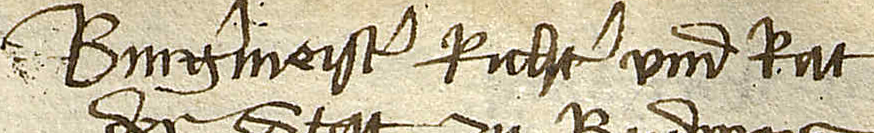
Burgmeiſt* Richt* vnd Rat
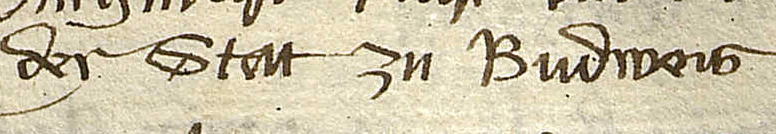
der Stat ʒu Budweis
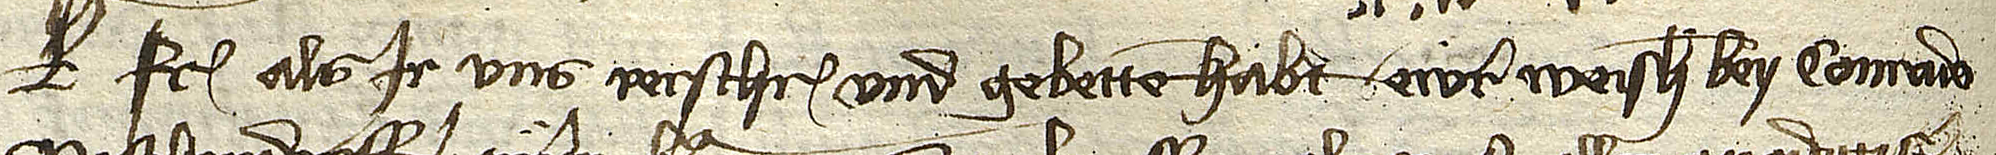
L* fr* als Ir vns verſchr* vnd gebette* habt / ew*r weiſh* bey Conrad
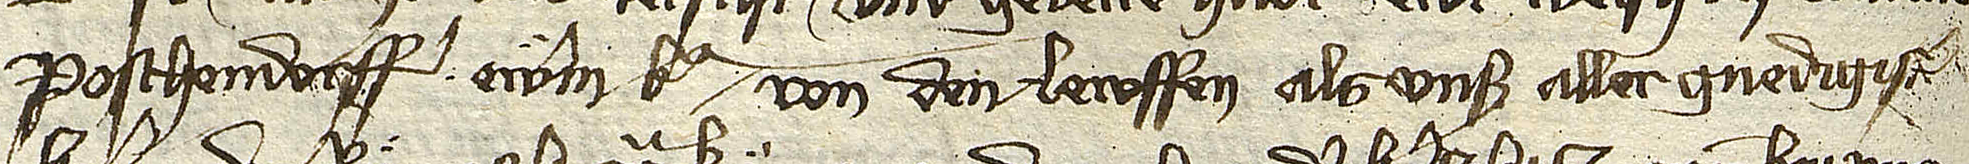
Poſthendorff* . ew*m b* / von den lewffen als vnſ* aller gnedigiſt*
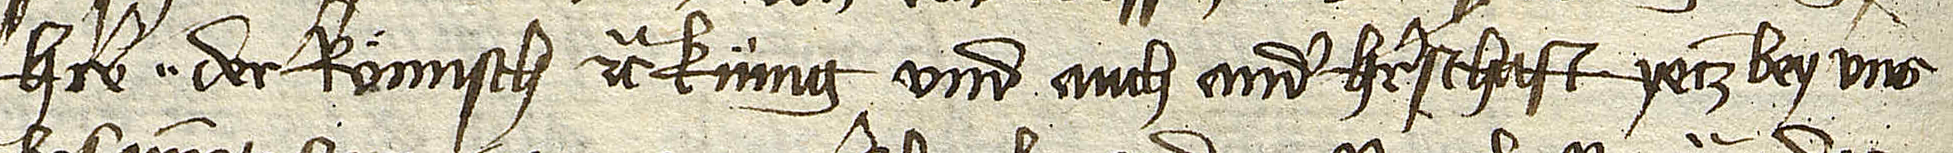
H*re ~ der Römiſch* ec* künig vnd auch and* h*rſchaft yecʒ* bey vns
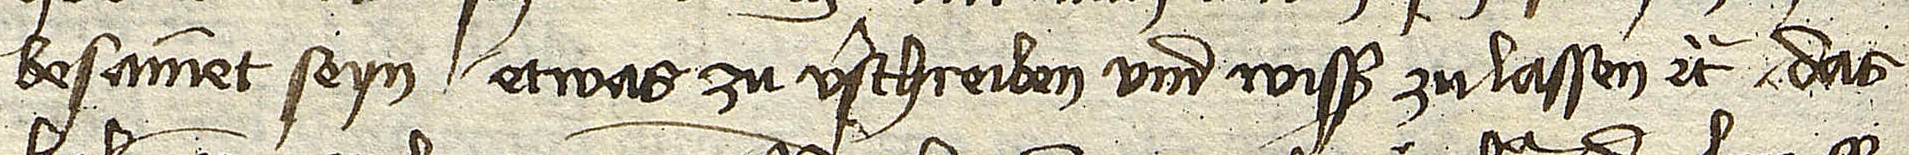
beſamet* ſeyn / etwas ʒu v*ſchreiben vnd wiſſ* ʒu laſſen ec* / das
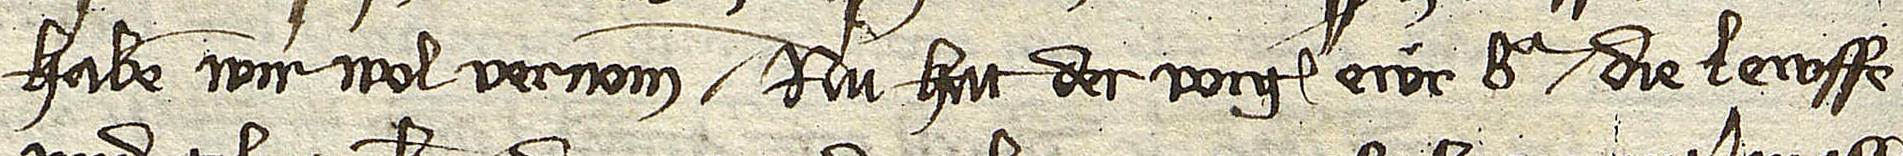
habe* wir wol vernom* / Nu hat der vorg* ewr b* / die lewffe
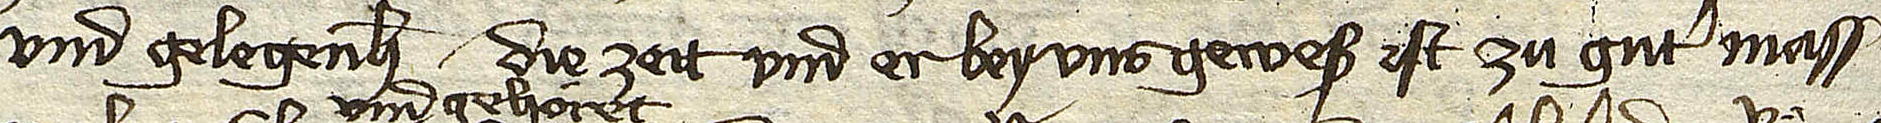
vnd gelegenh* / die ʒeit vnd er bey vns geweſ* iſt ʒu gut* maſſ
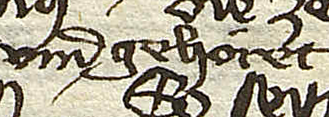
vnd gehöret
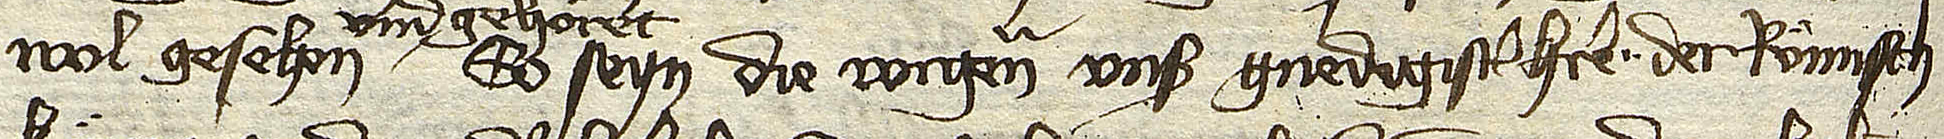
wol geſehen / So ſeyn die vorgen* vnſ* gnedigiſt* h*re ~ der Römiſch*
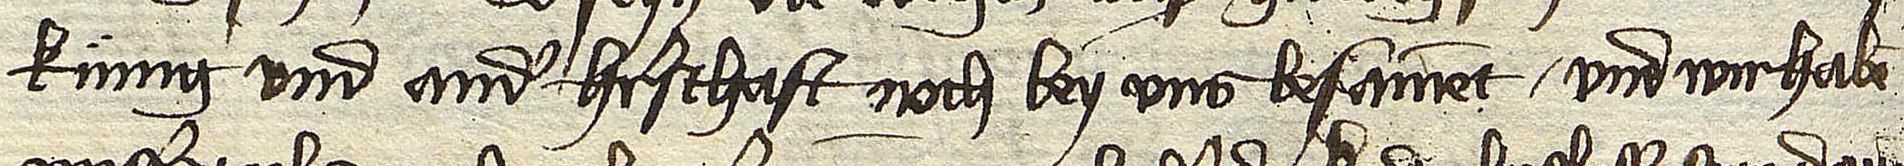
künig vnd and* h*rſchaft noch bey vns beſamet* / vnd wir habe*
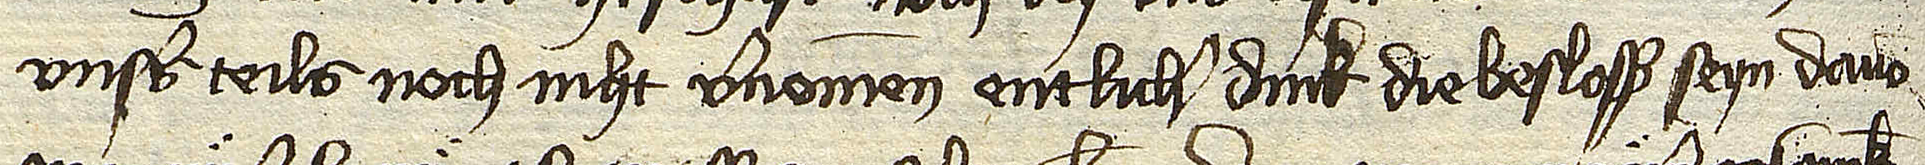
vnſ*s teils noch niht v*nom*en entlich* dink die beſloſſ* ſeyn dauo*
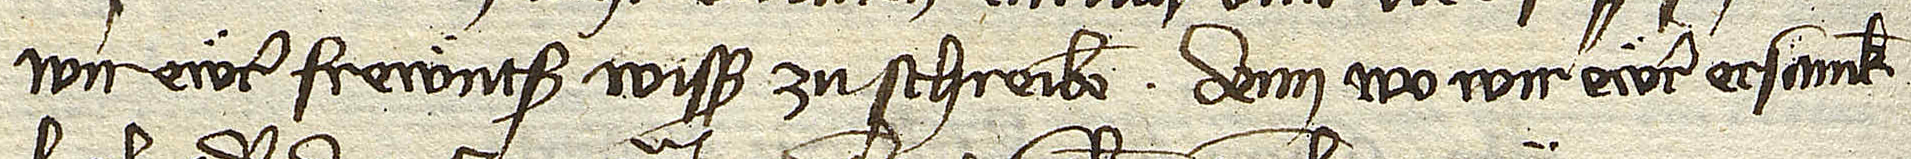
wir ew*r frewntſ* wiſſ* ʒu ſchreibe* . Denn wo wir ew*r erſamk*
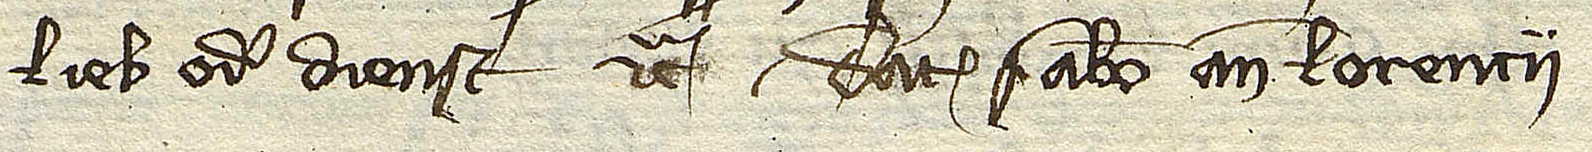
lieb od* dienſt ec* / Dat* ſabo* an* lorencii
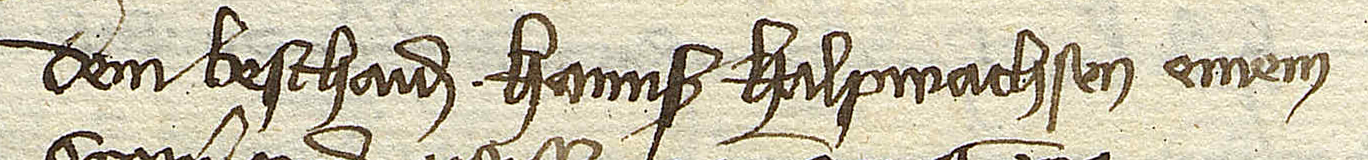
Dem beſchaid* . Hannſ* Halpwachſen einem
